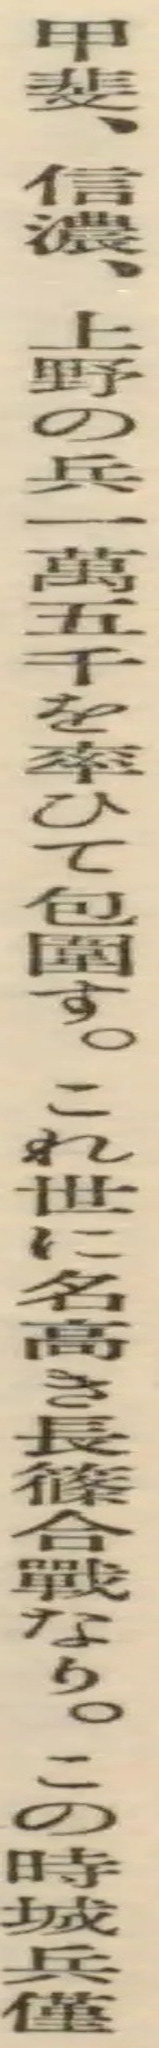甲斐、信濃、上野の兵一万五千を率ひて包囲す。これ世に名高き長篠合戦なり。この時城兵僅
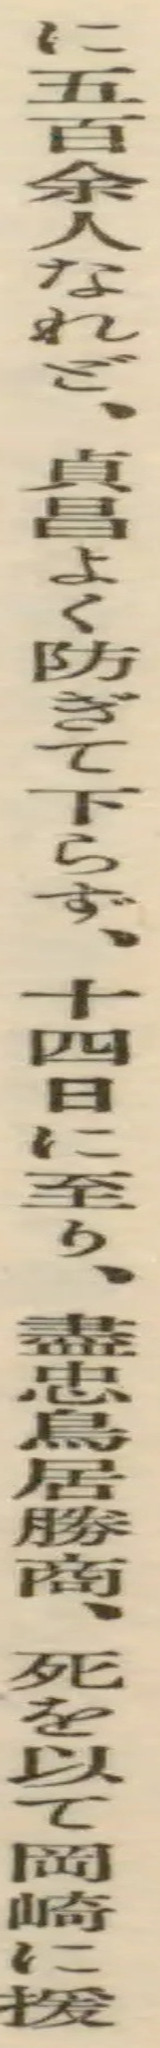に五百余人なれど、貞昌よく防ぎて下らず、十四日に至り、尽忠鳥居勝商、死を以て岡崎に援
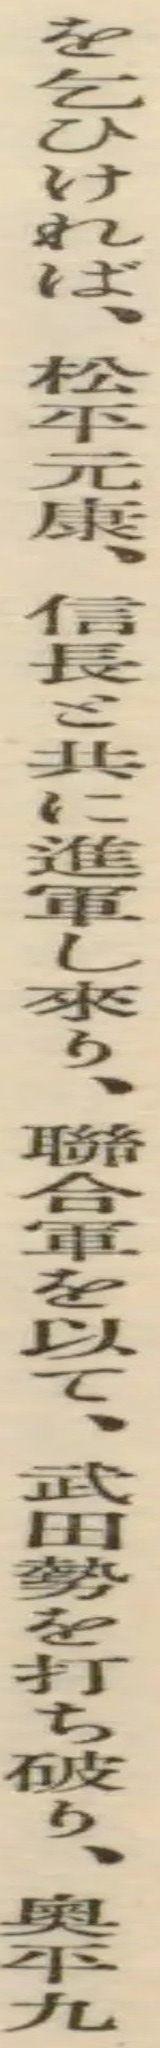を乞ひければ、松平元康、信長と共に進軍し来り、連合軍を以て、武田勢を打ち破り、奥平九
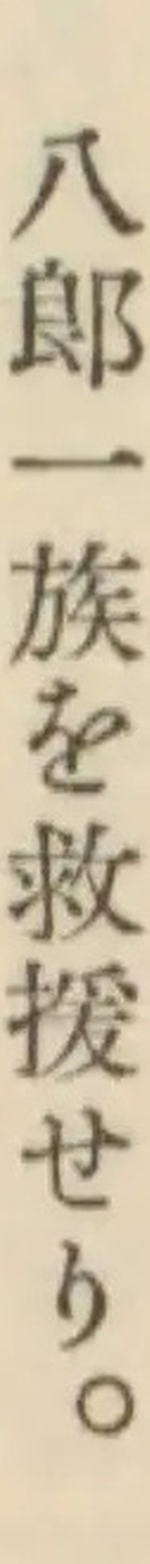八郎一族を救援せり。
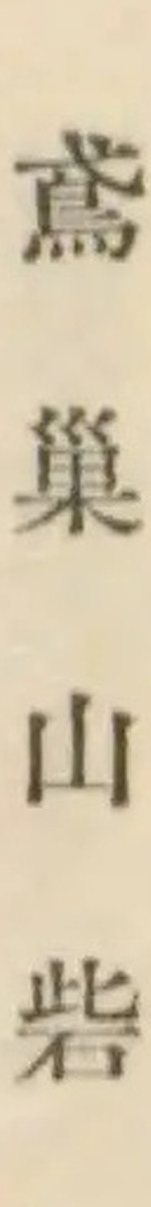鳶巣山砦
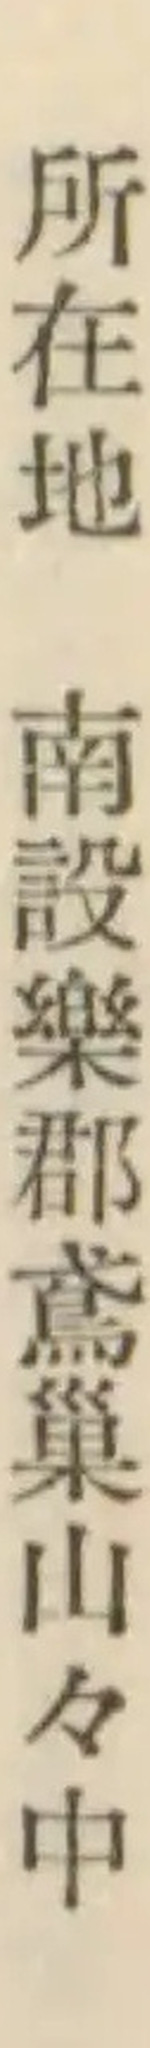所在地南設楽郡鳶巣山々中
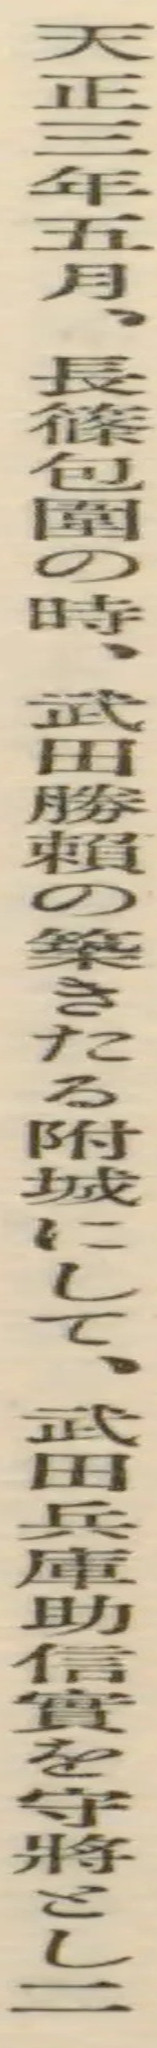天正三年五月、長篠包囲の時、武田勝頼の築きたる附城にして、武田兵庫助信実を守将とし二
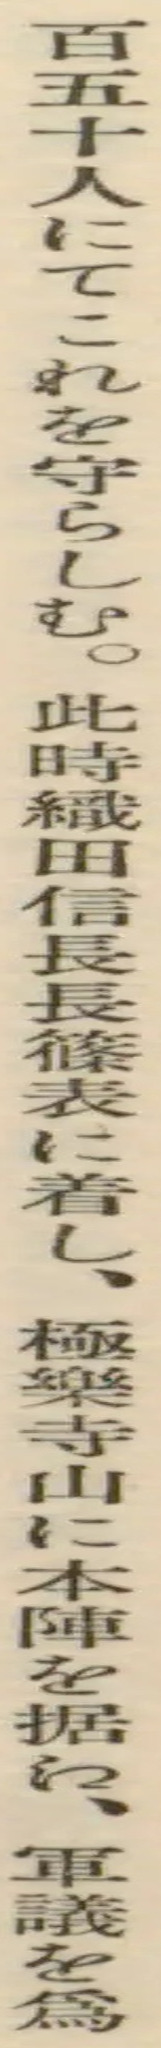百五十人にてこれを守らしむ、此時織田信長長篠表に着し、極楽寺山に本陣を据え、軍議を為
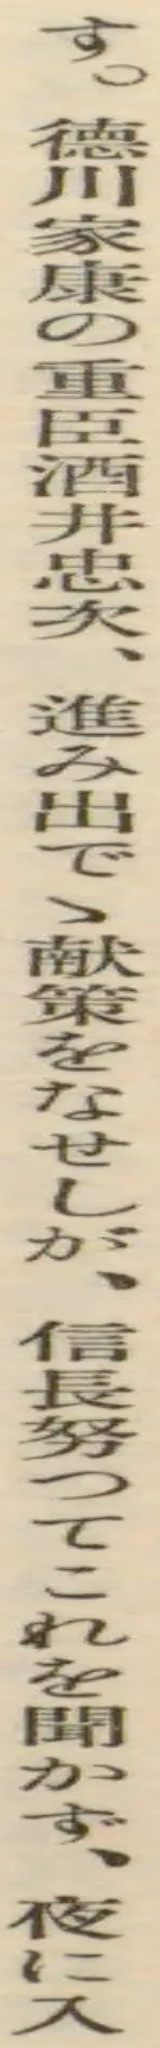す。徳川家康の重臣酒井忠次、進み出でゝ献策をなせしが、信長努つてこれを聞かず、夜に入
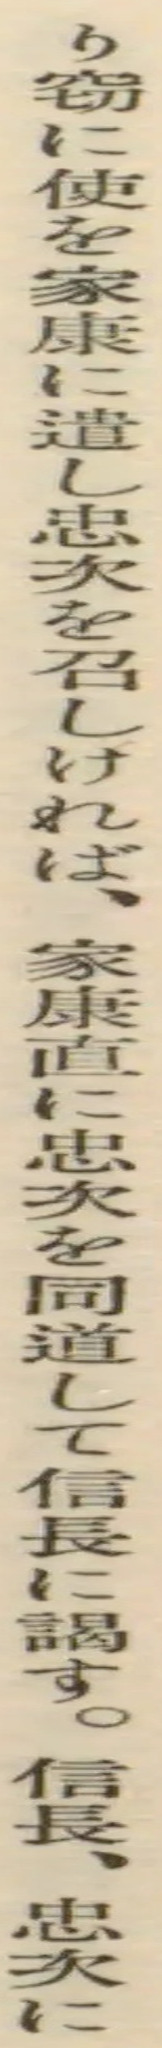り窃に使を家康に遣し忠次を召しければ、家康直に忠次を同道して信長に謁す。信長、忠次に
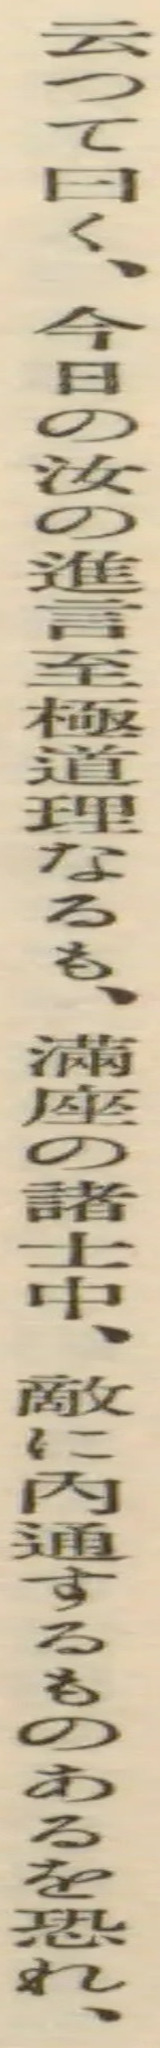云つて曰く、今日の汝の進言至極道理なるも、満座の諸士中、敵に内通するものあるを恐れ、
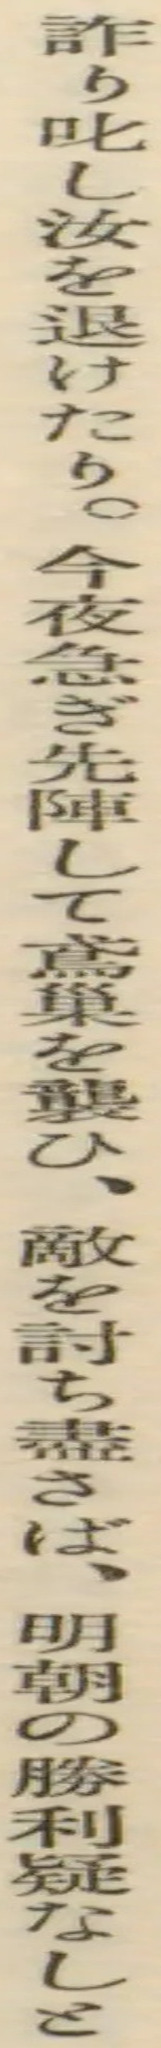詐り叱し汝を退けたり。今夜急ぎ先陣して鳶巣を襲ひ、敵を討ち尽さば、明朝の勝利疑なしと
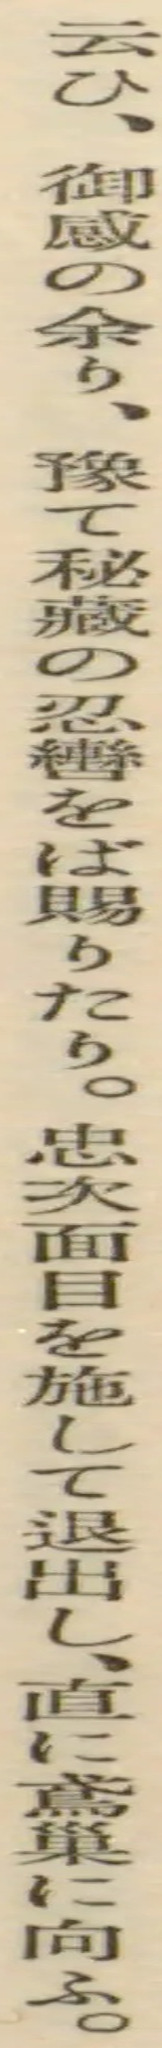云ひ、御感の余り、予て秘蔵の忍轡をば賜りたり。忠次面目を施して退出し、直に鳶巣に向ふ。

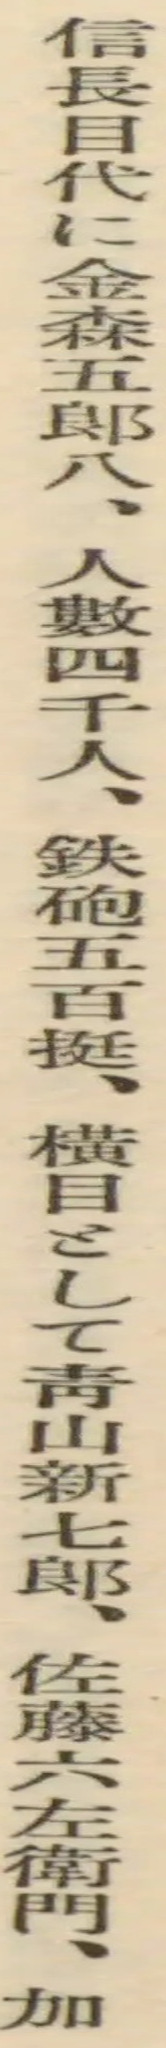信長目代に金森五郎八、人数四千人、鉄砲五百挺、横目として青山新七郎、佐藤六左衛門、加
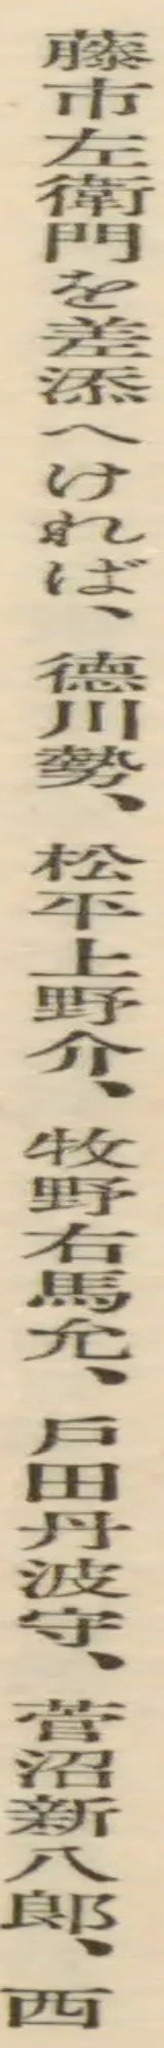藤市左衛門を差へければ、徳川勢、松平上野介、牧野右馬允、戸田丹波守、菅沼新八郎、西
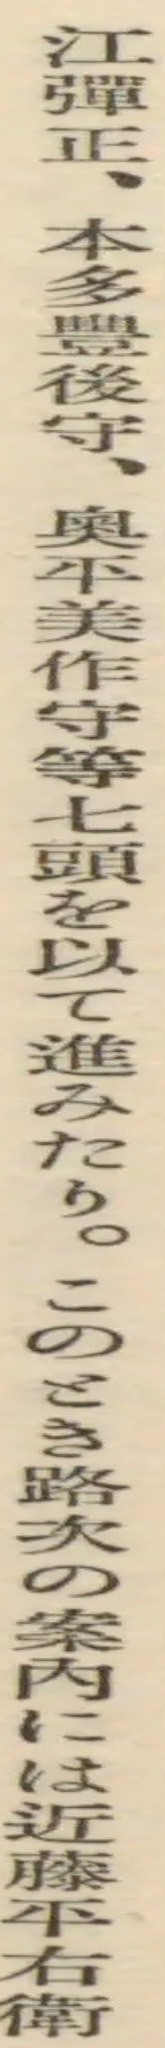江弾正、本多豊後守、奥平美作守等七頭を以て進みたり。このとき路次の案内には近藤平右衛
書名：東三河之古城
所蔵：国立国会図書館 National Diet Library, JAPAN
